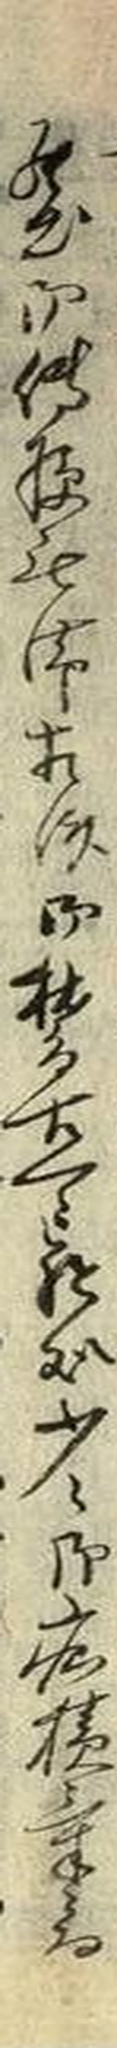罷出御伝授無滞相済御稽古可被遊候処少々御疝積気ニ而
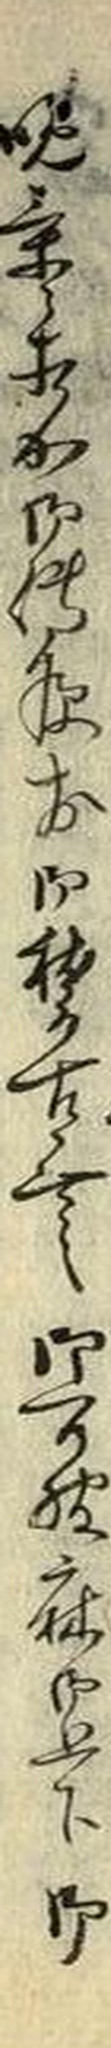晩気ニ相成御伝授前御稽古無之御召服麻御上下御
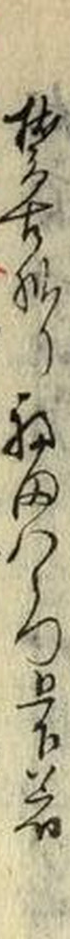稽古掛り福田八右衛門上下着
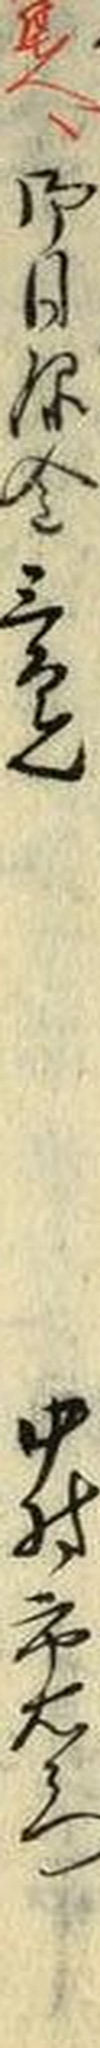御目録金三百疋中村市右衛門
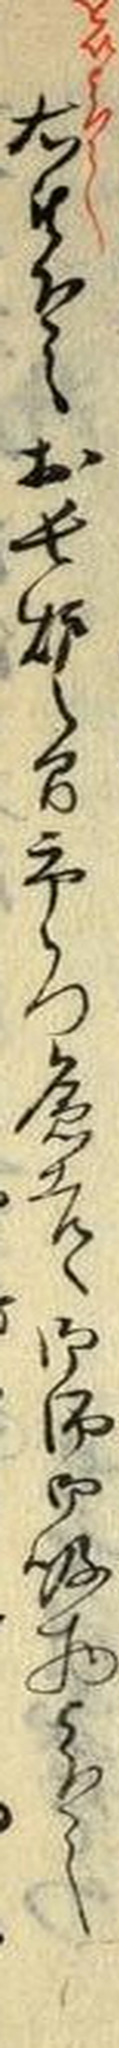右被下之於長炉之間市右衛門廉吉へ御酒御吸物被下之
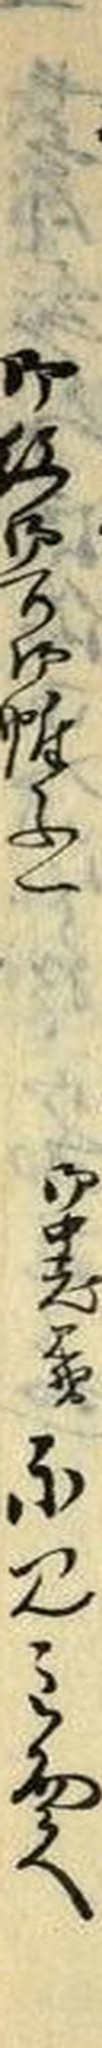御紋御召御帷子一御中老見習永見主殿
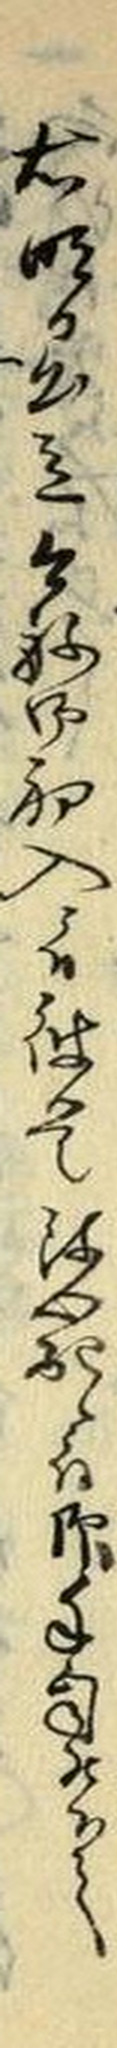右明日出立今般御初入ニ付彼是致心配候ニ付御手自被下之
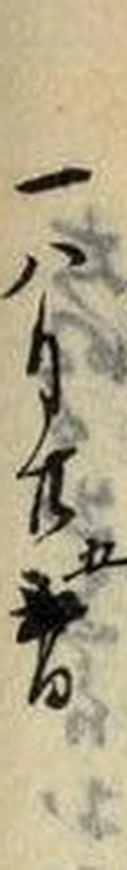一八月廿五日
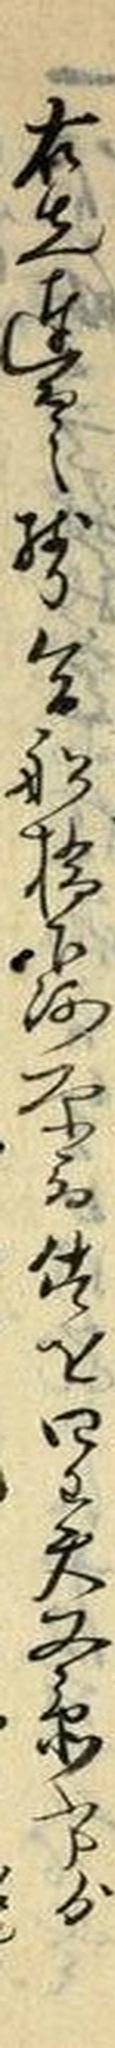右先達而之残り今日船橋下河原ニ而仕候を四王天又兵衛方ゟ
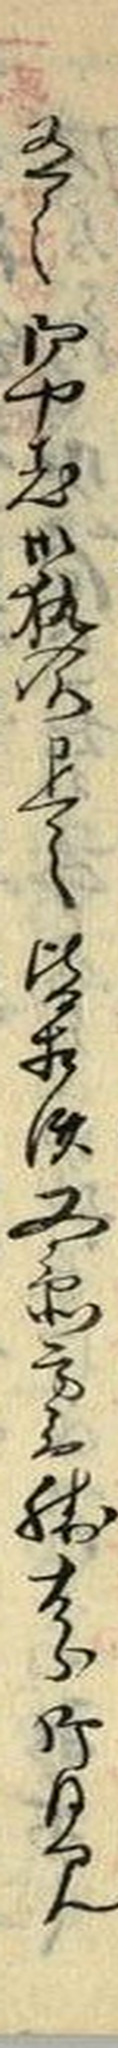有之御中老御執合申上之皆相済又兵衛方ニ而勝太郎御目見
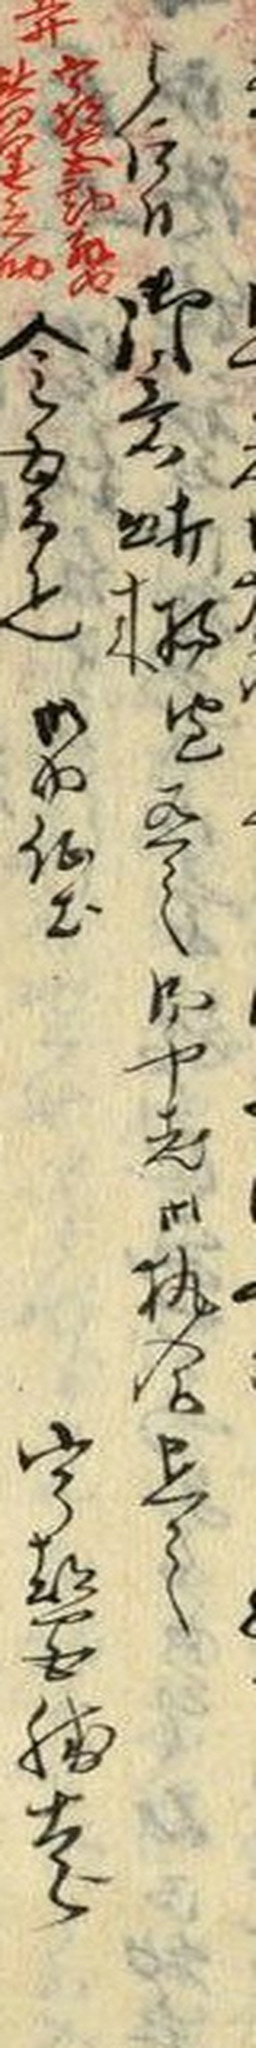金五百疋御内証出宇都宮勝太郎
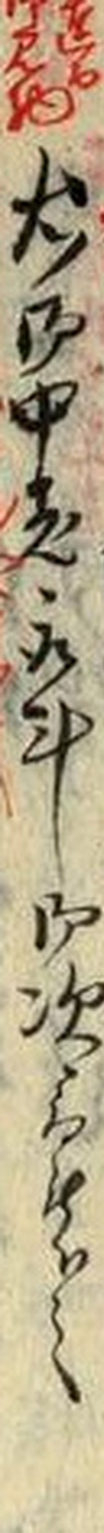右御中老取計御次ニ而被下之
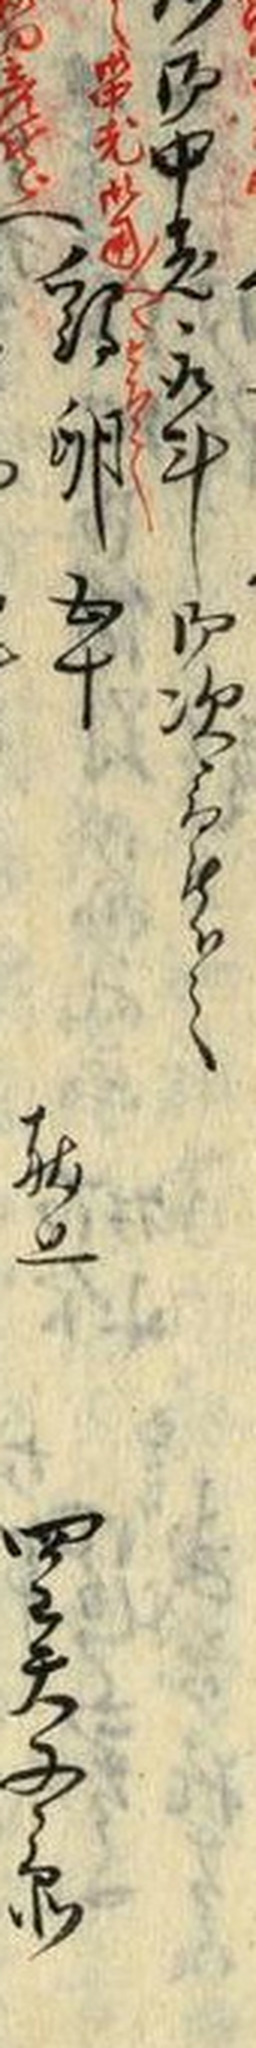寿酒弐升献上四王天又兵衛
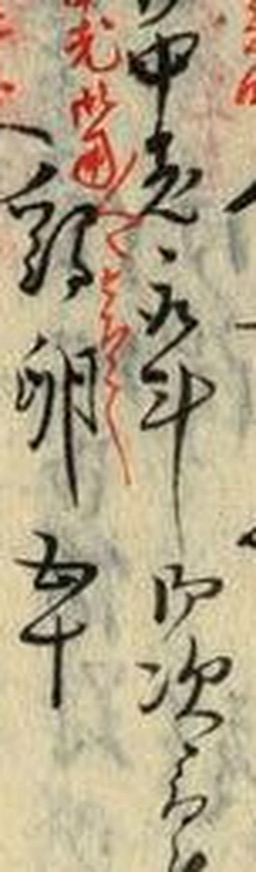鶏卵五十
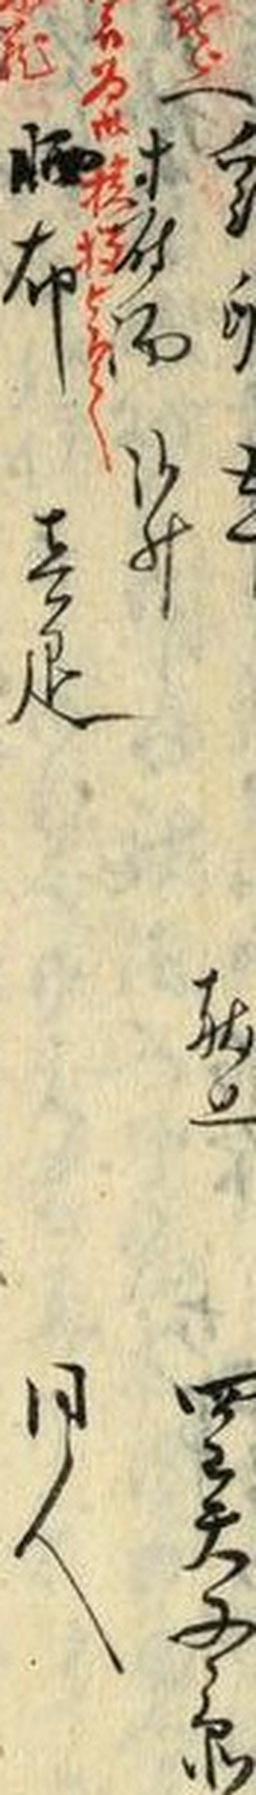晒布壱疋同人
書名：少傅日録抄（斉承付側向頭取日記、在国）
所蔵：福井県文書館 Fukui Prefectural Archives
